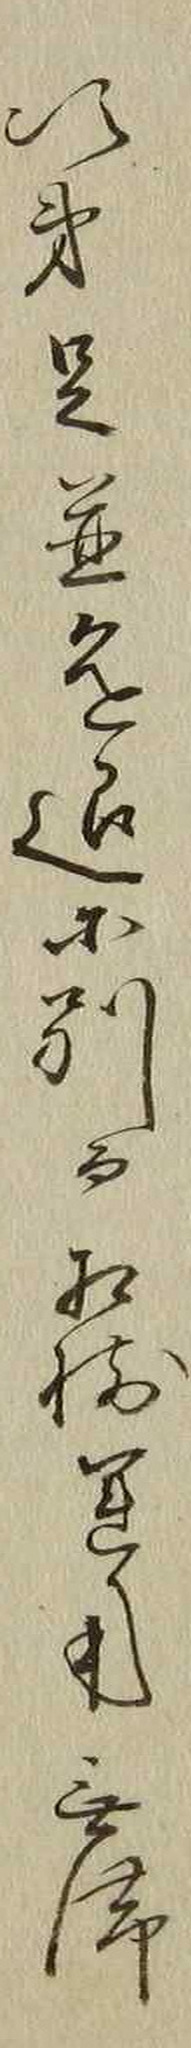次第足並進退等別而相揃運用無滞
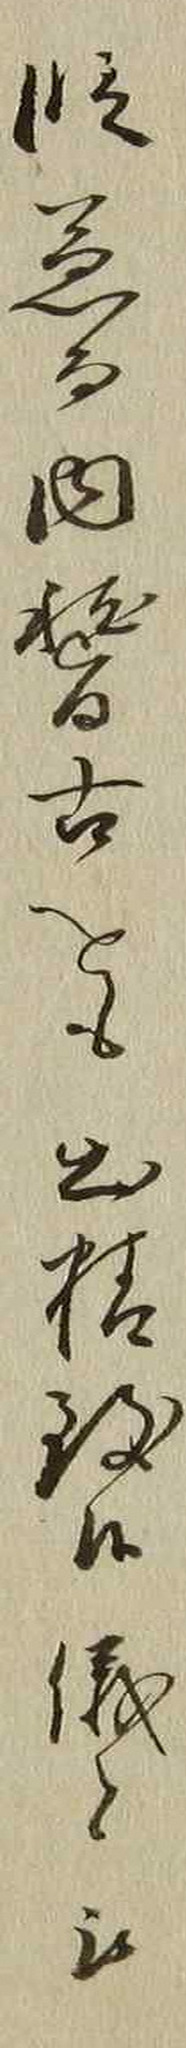段兼而内稽古をも出精致候儀と被
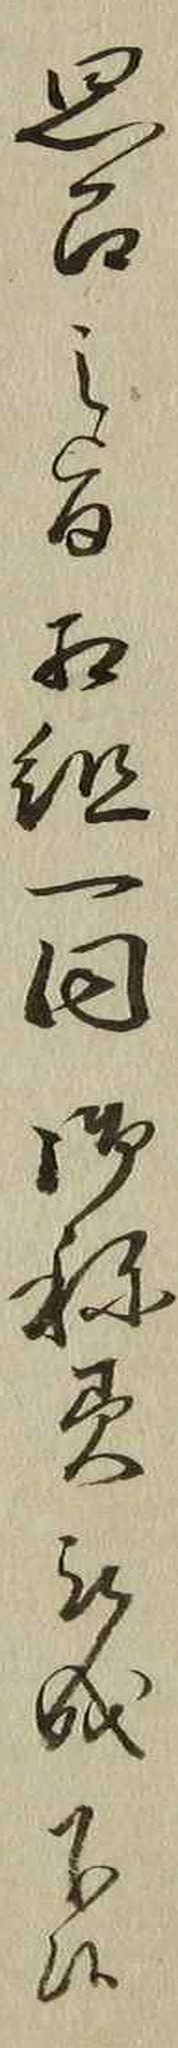思召之旨相組一同御称美被成下候
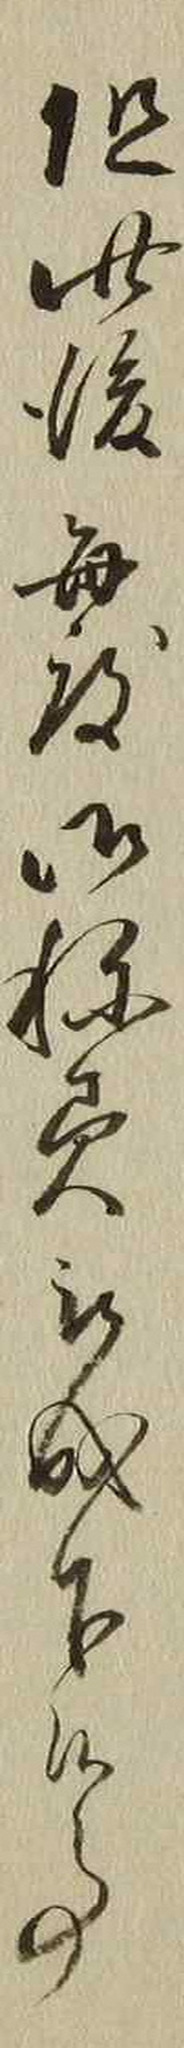但此後毎度御称美被成下候事
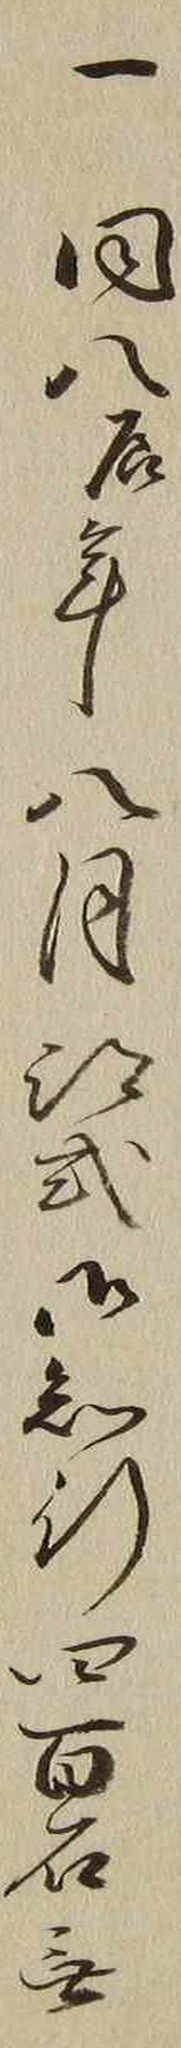一同八辰年八月跡式御知行四百石無
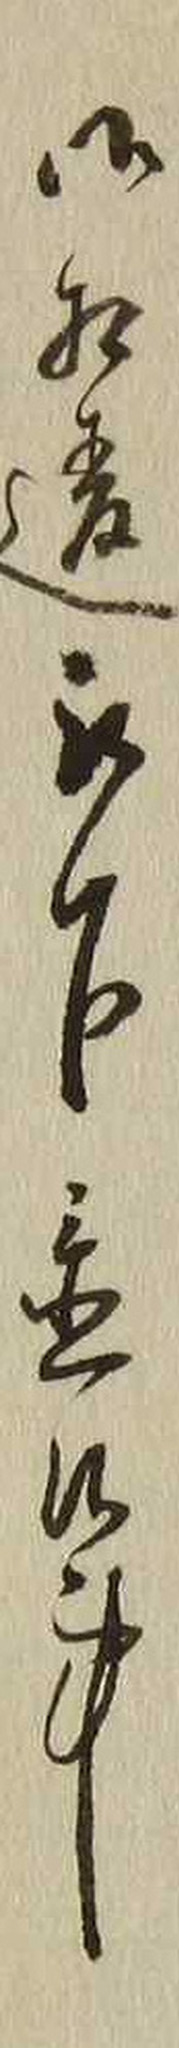御相違被下置候事
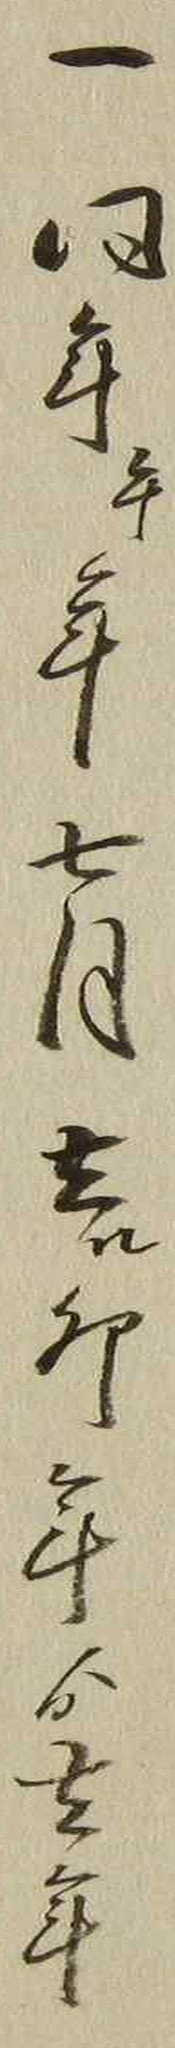一同年午年七月去ル卯年ゟ去年
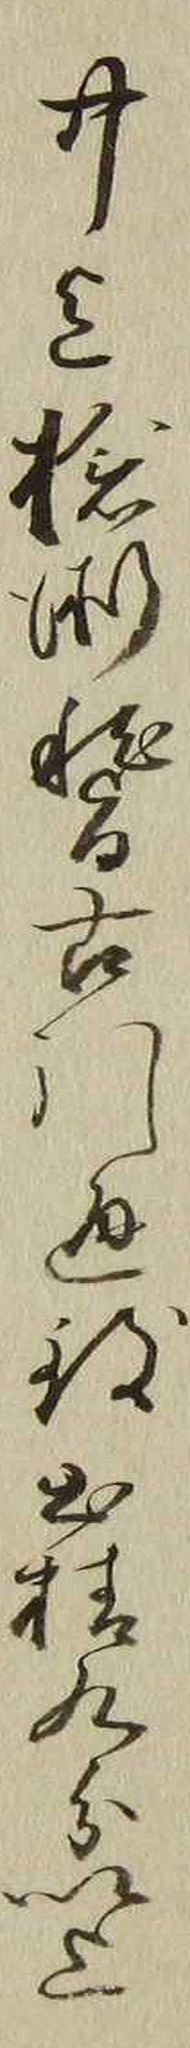中迄槍術稽古引通致出精九分以上
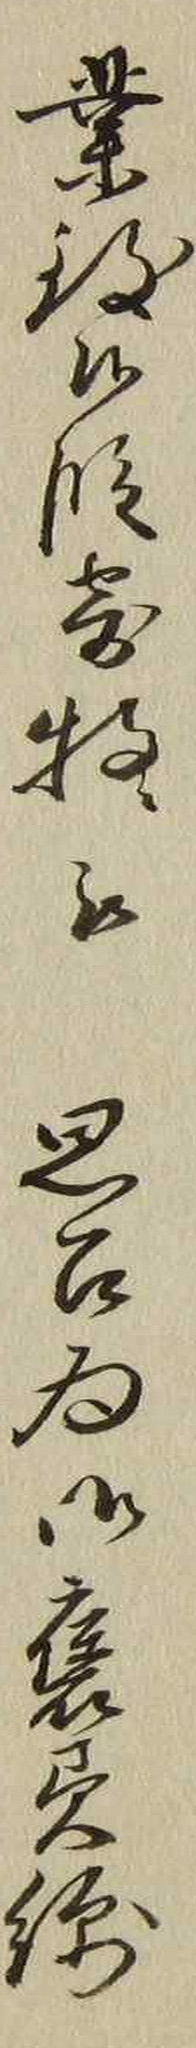業致候段奇特ニ被思召為御褒美綿
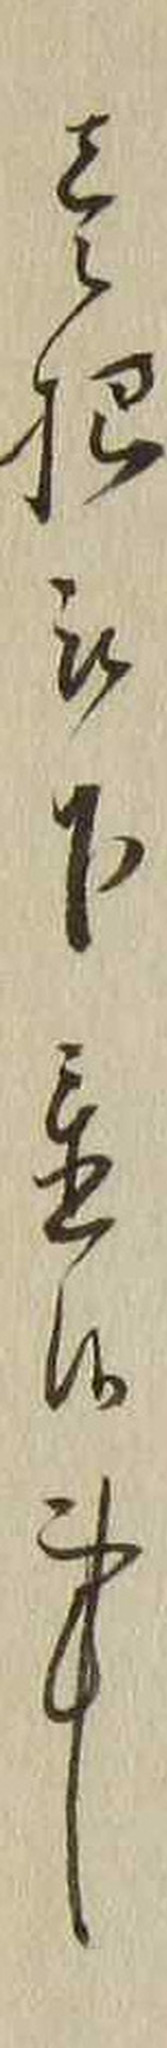壱把被下置候事
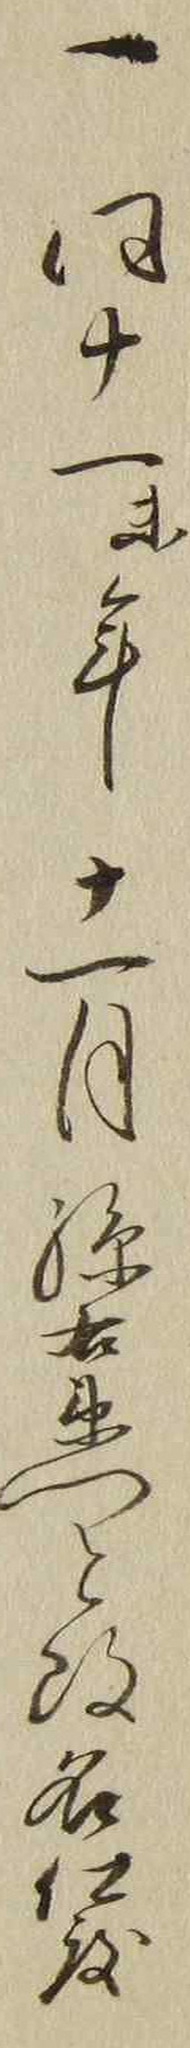一同十一未年十一月孫右衛門と改名仕度
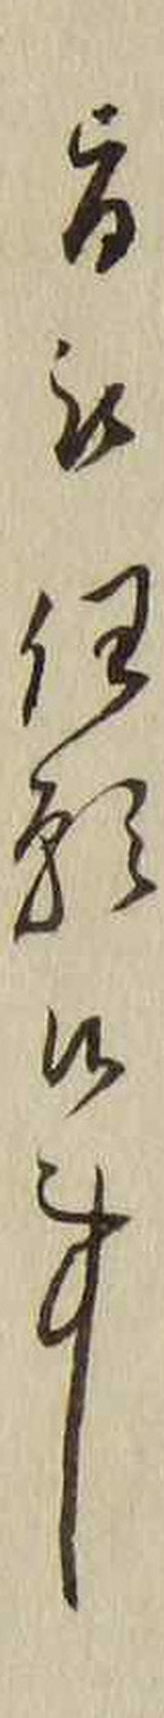旨被任願候事

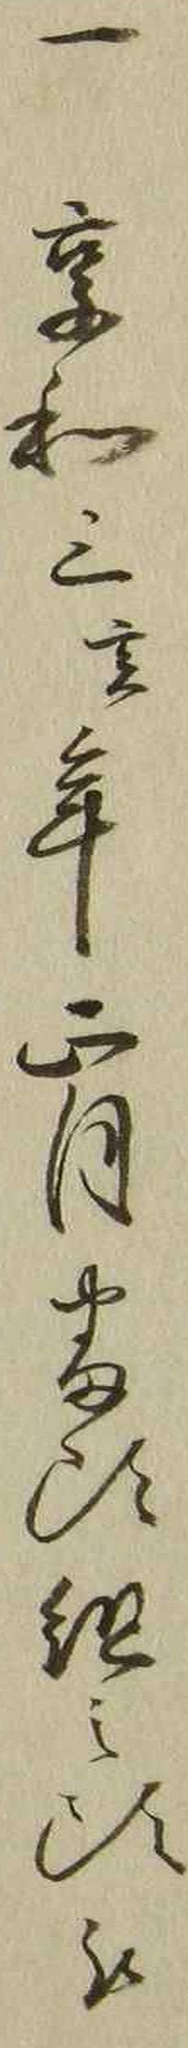一享和三亥年正月番頭組之頭被
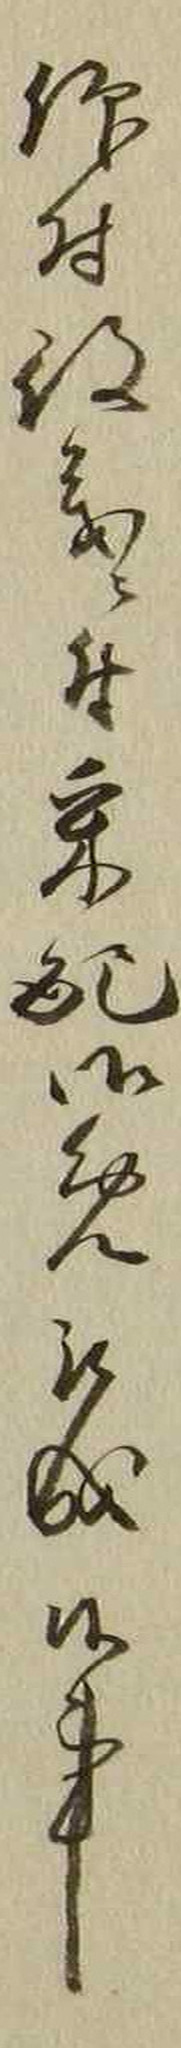仰付役義ニ付采配御免被成候事
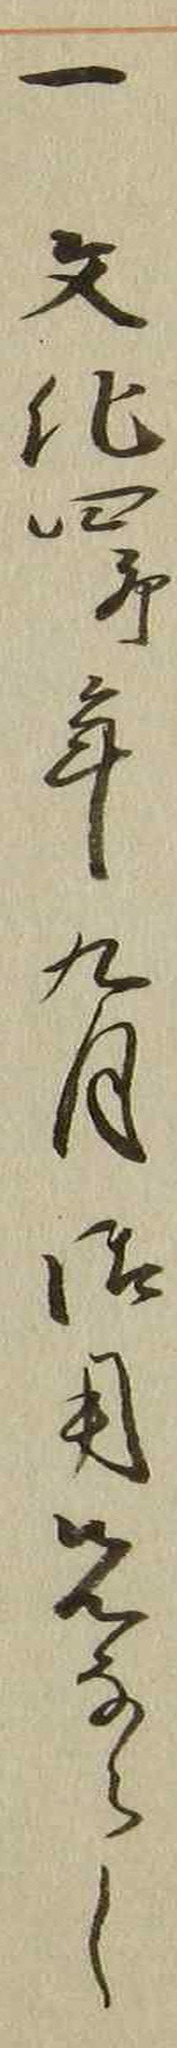一文化四卯年九月御用先ならし
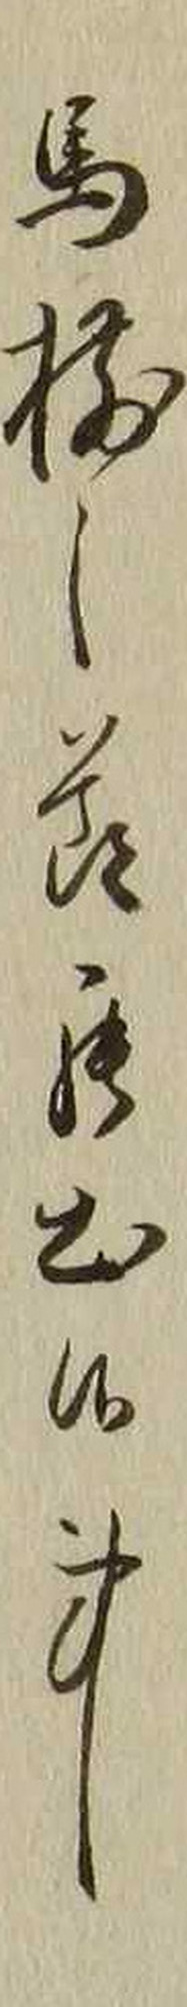馬揃之節罷出候事
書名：諸士系譜　巻之68　を之部2
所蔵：会津若松市立会津図書館
